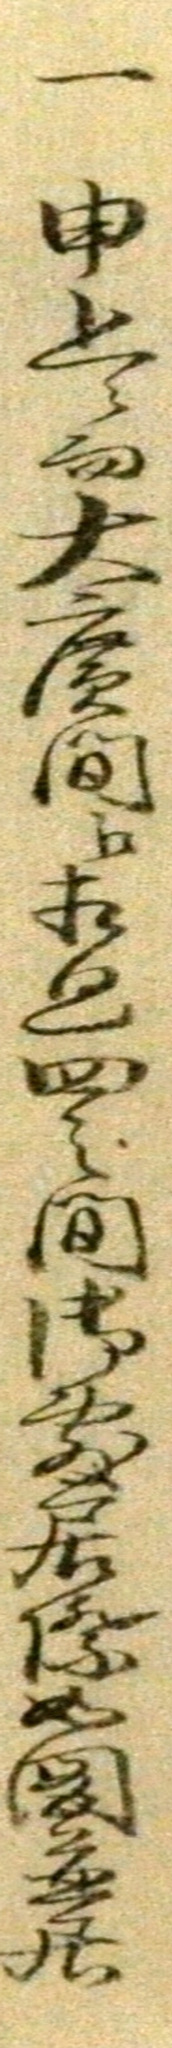一申上ニ而大広間え相廻四之間御敷居際如図並居
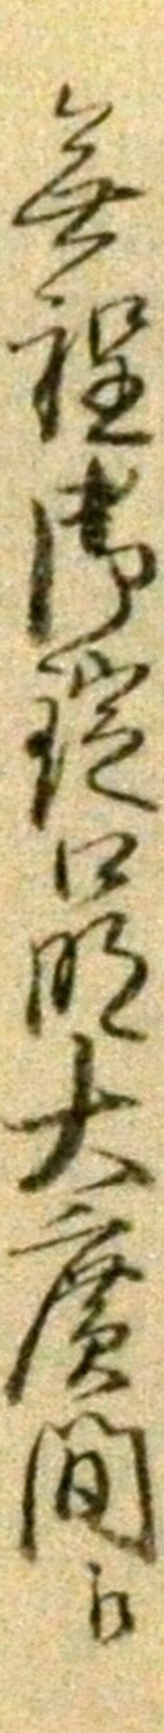無程御錠口明大広間え
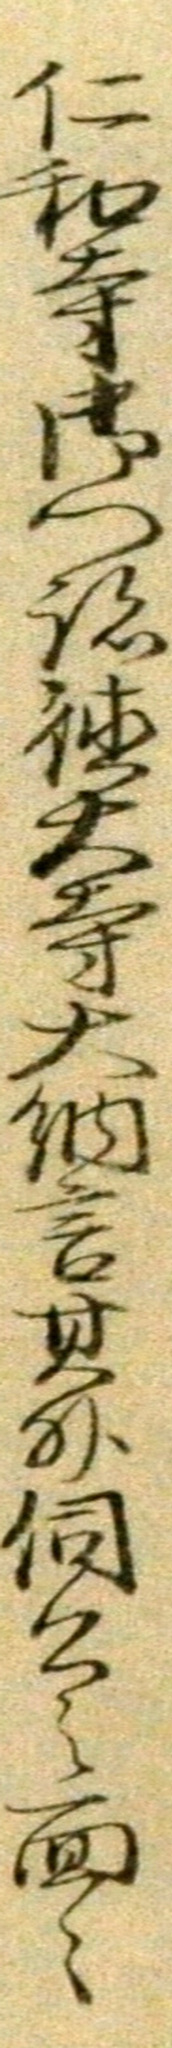仁和寺御門跡徳大寺大納言其外伺公之面々
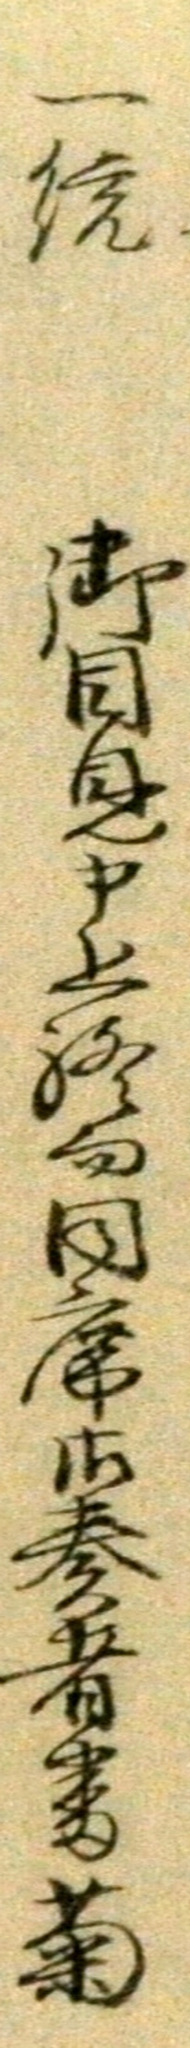一統御目見申上終而同席御奏者番菊
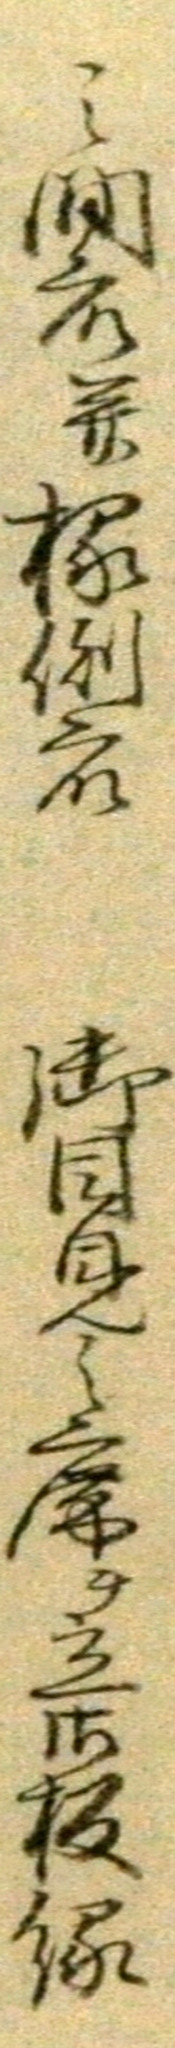之間衆并縁側衆御目見之席ヲ立御板縁
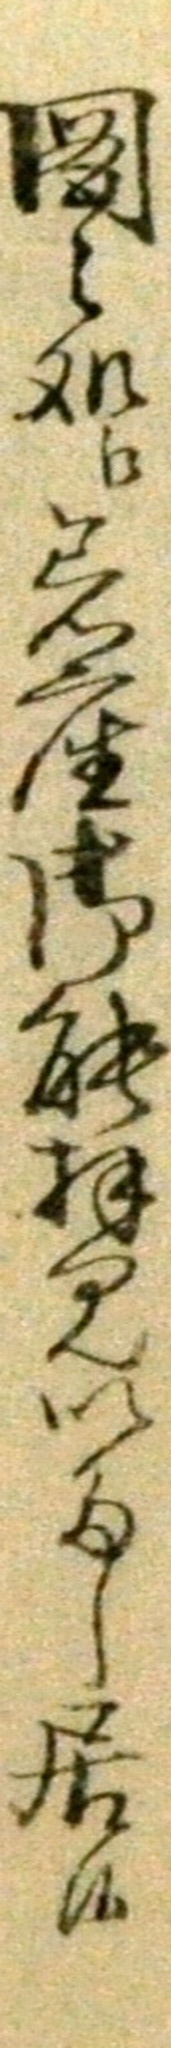図之処え着座御能拝見いたし居候

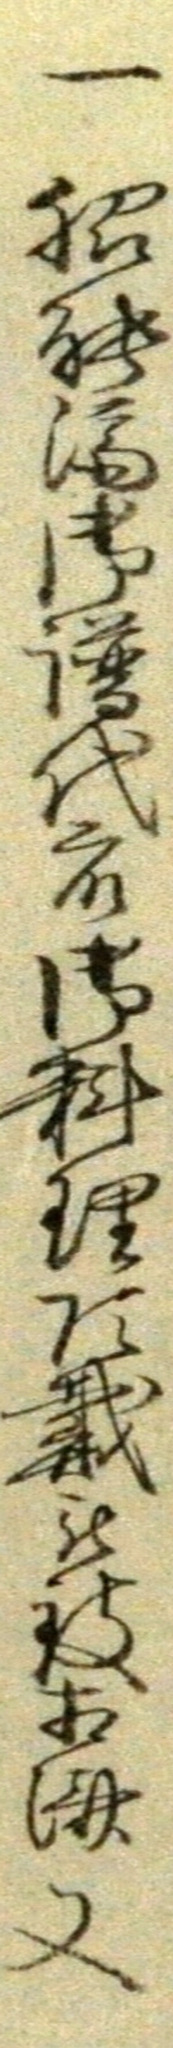一脇能済御譜代衆御料理頂戴被致相済又
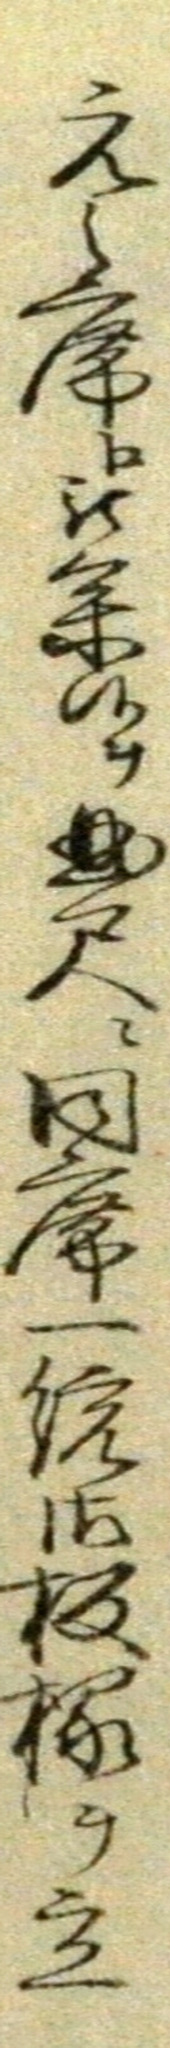元之席え被参候ヲ曲尺ニ同席一統御板椽ヲ立
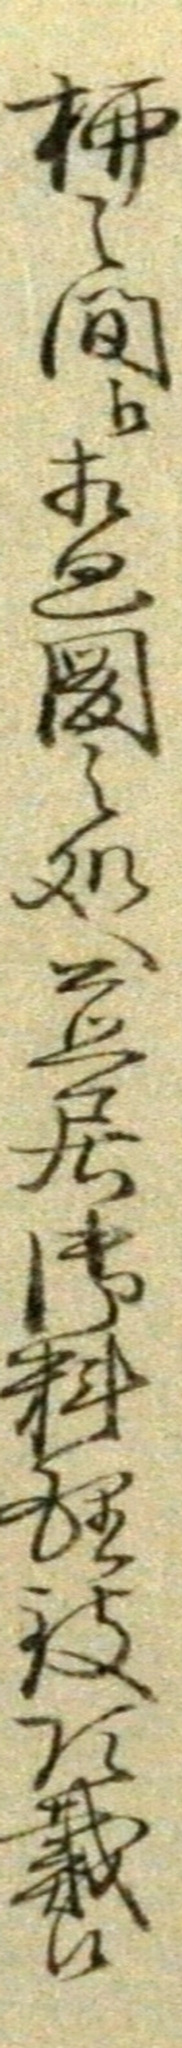柳之間え相廻図之処へ並居御料理致頂戴候
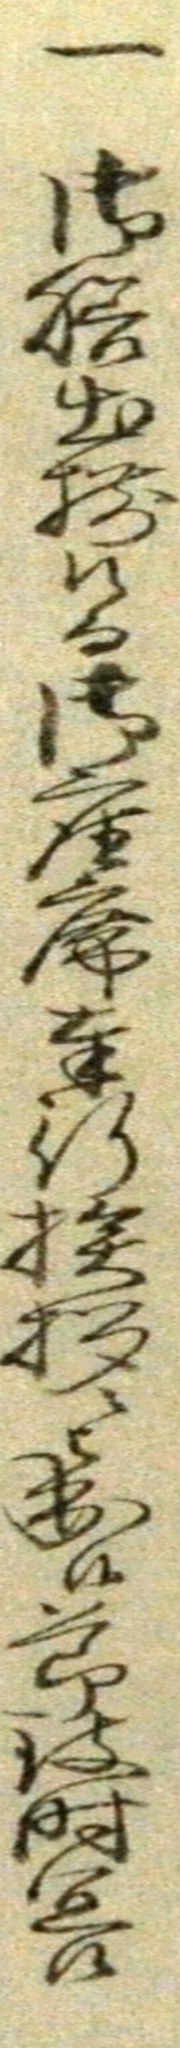一御膳出揃候而御座席奉行挨拶ニ被出候節致時宜候
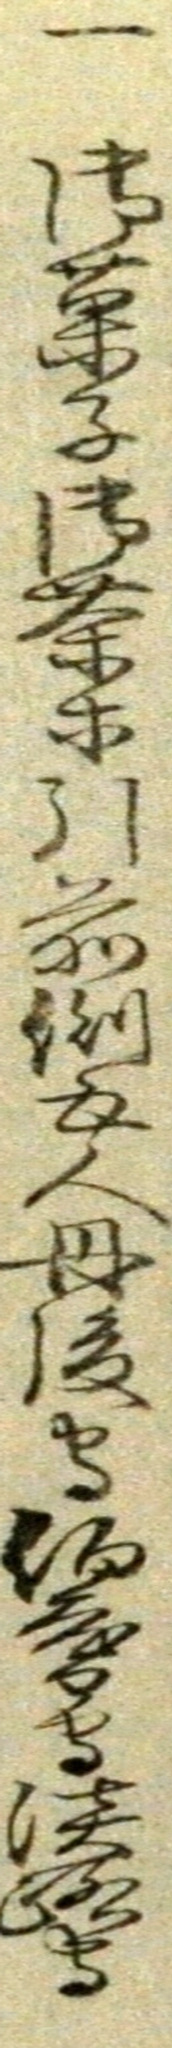一御菓子御茶等引前側五人丹後守伯耆守淡路守
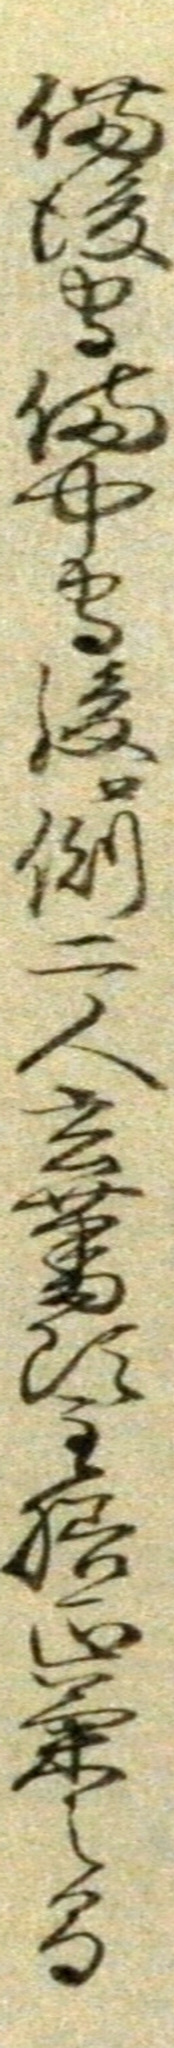備後守備中守後ロ側二人玄蕃頭主膳正菊之間
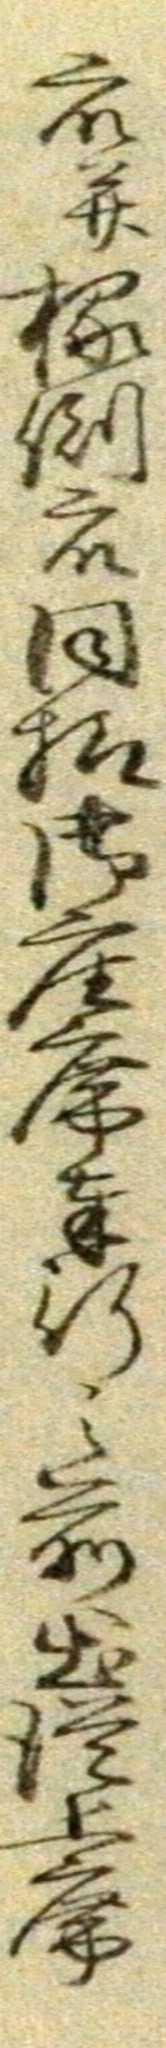衆并椽側衆同様御座席奉行之前へ出従上席
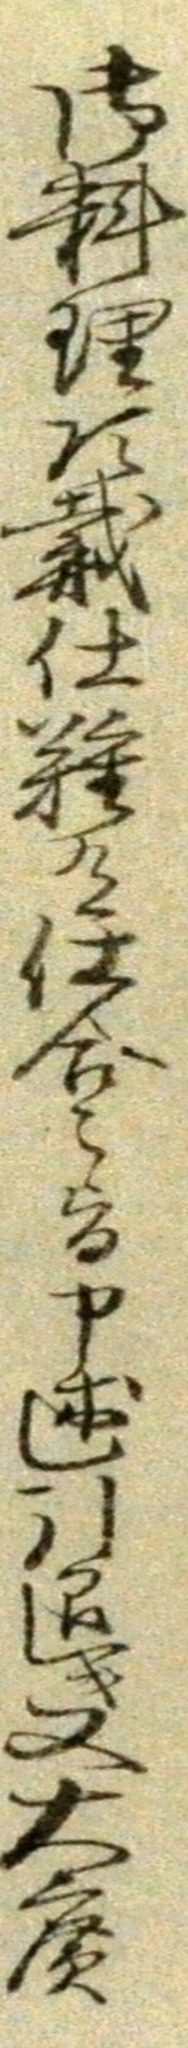御料理頂戴仕難有仕合之旨申述引退キ又大広
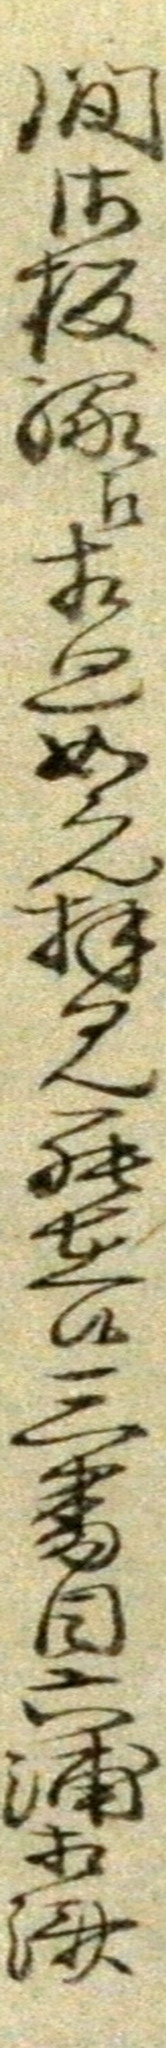間御板縁え相廻如元拝見罷在候三番目六浦相済
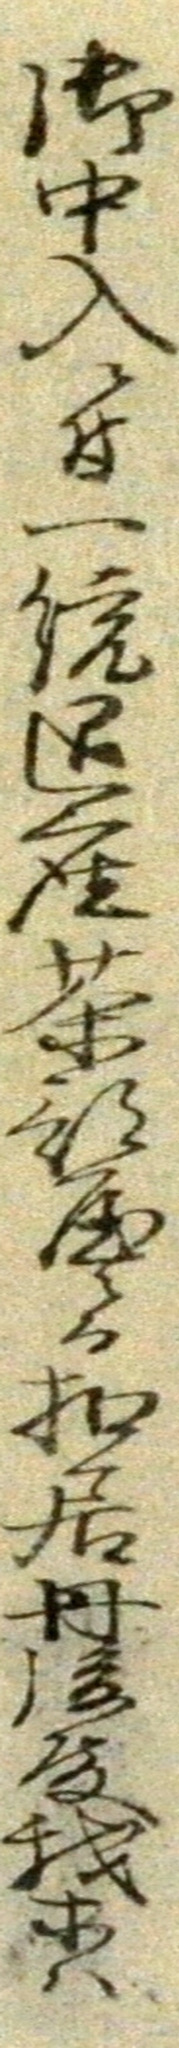御中入ニ付一統退座茶部屋ニ而扣居丹後殿我等ハ
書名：諸留書〔一括〕
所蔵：伊那市立高遠町図書館・合同会社AMANE
